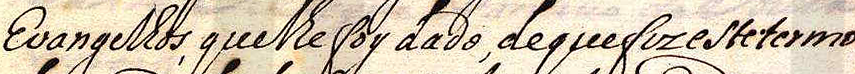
Evangelhos, que lhe foy dado, de que fiz este termo
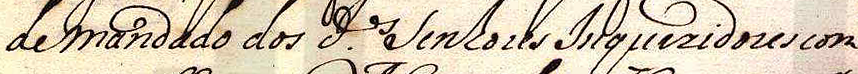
de mandado dos d.os senhores Inquizidores com
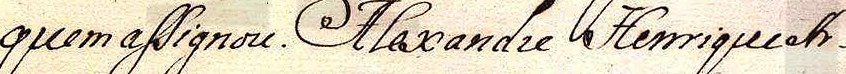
quem assignou. Alexandre Henrique Ar
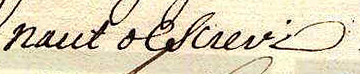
naut o eScrevi
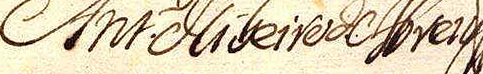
Ant.o FiGeiredo Abreu
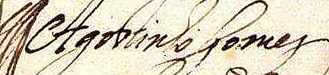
Agostinho Gomes
